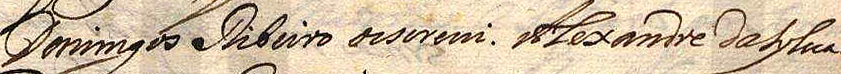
Domingos Ribeiro o escrevi. Alexandre de Sylva
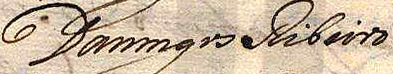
Domingos Ribeiro.
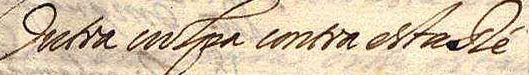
Outra culpa contra esta Ré
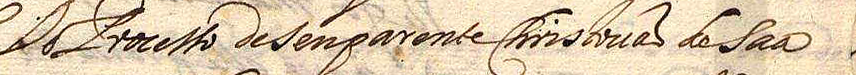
Do processo de seu parente Christovão de Saa
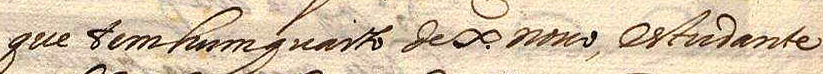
que tem hum quarto de x. novo, estudante
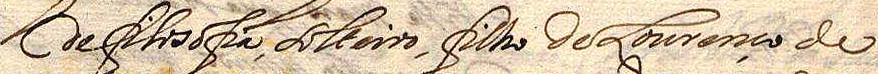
de filosofia, solteiro, filho de Lourenço de
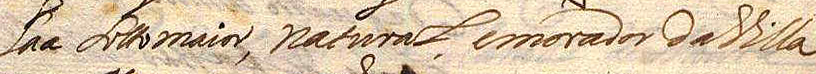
Saa Sottomaior, natural e morador da Villa
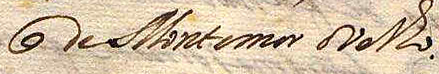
de Montemor o Velho.
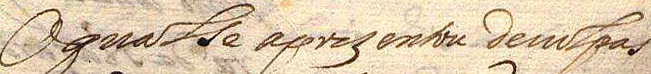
O qual se aprezentou de culpas
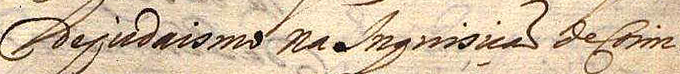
de judaismo na Inquisiçaõ de Coim
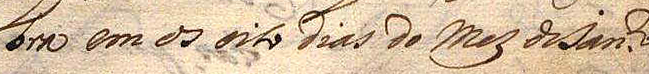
bra em os oito dias do mez de Jan.ro
